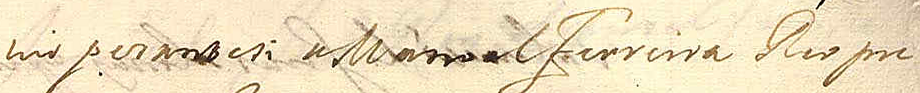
uir perante si a Manoel Ferreira Reo pre
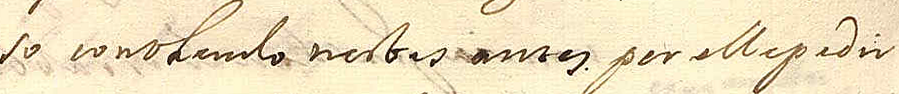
so contheudo nestes autos por elle pedir
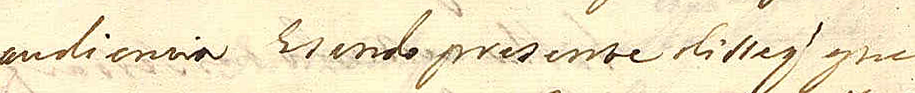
audiencia E sendo presente disse q̄ que
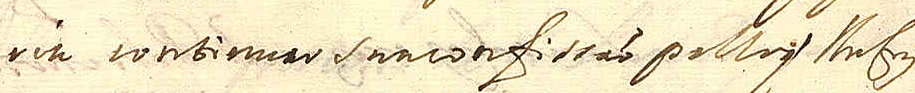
ria continuar sua confissaõ pello q̄ lhe foy
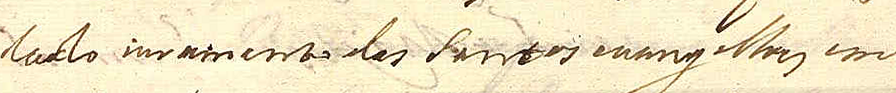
dado iuramento dos Santos euangelhos em
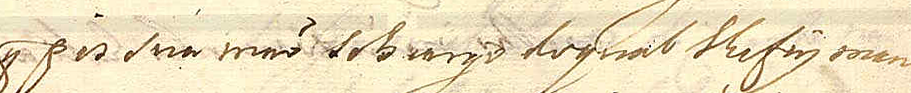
q̄ pos sua mão sob cargo do qual lhe foy man
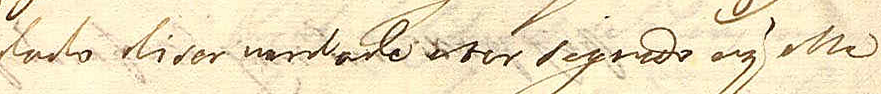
dado diser uerdade e ter segredo o q̄ elle
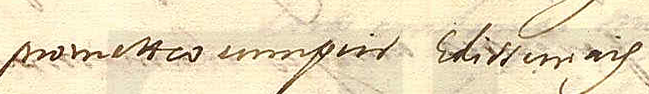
prometteo cumprir. E disse mais
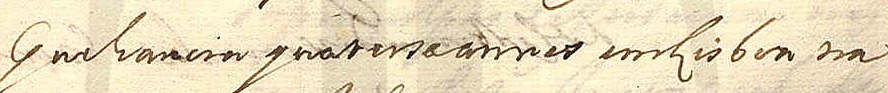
Que hauera quatorse annos em Lisboa na
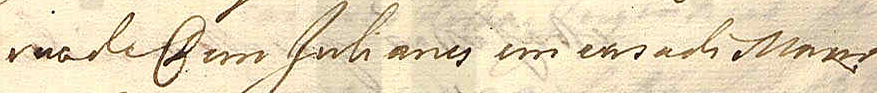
rua de Dom Julianes em casa de Mano
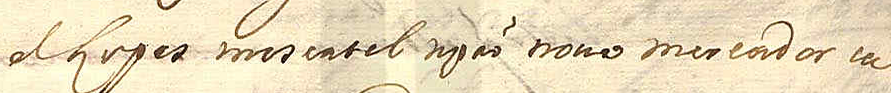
el Lopes moscatel xpaõ nouo mercador ca
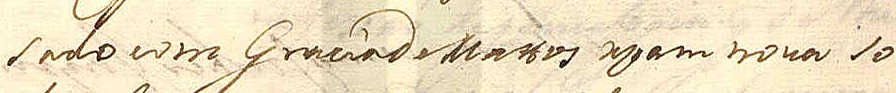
sado com Gracia de Mattos xpam noua so
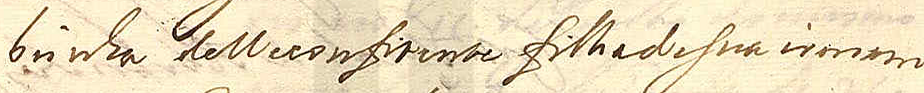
brinha delle confitente filha de Sua irmam
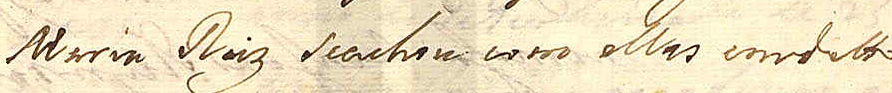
Maria Roiz se achou com ellas e no ditto
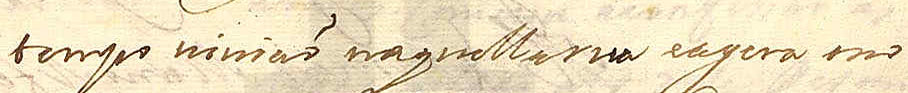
tempo uiuiaõ naquella rua e agora mo
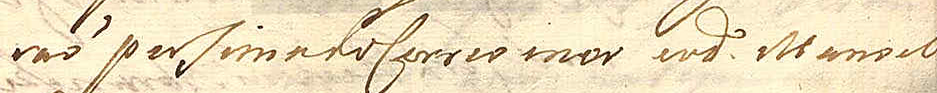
raõ por sima do Correo mor e o do. Manoel
